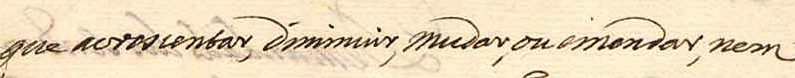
que acrescentar, diminuir, mudar, ou emendar, nem
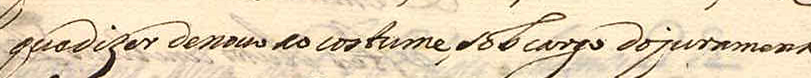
que dizer de nouo do costume, sob cargo do juramento
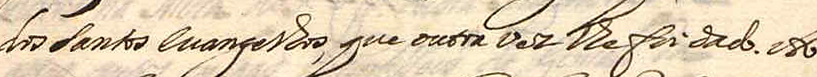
dos santos Euangelhos, que outra vez lhe foi dado. Ao
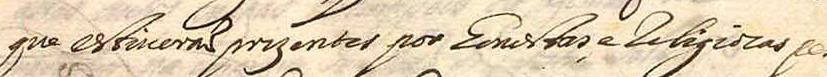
que estiueraõ prezentes por honestas, e Religiozas pes
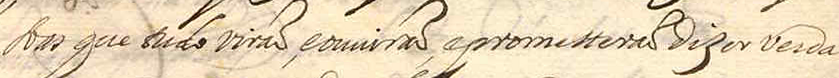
soas que tudo virão, e ouuirão, e prometteraõ dizer verda
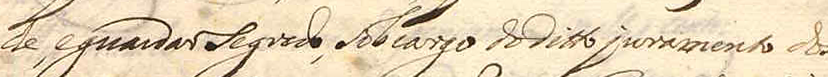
de, e guardar segredo, sob cargo do ditto juramento dos
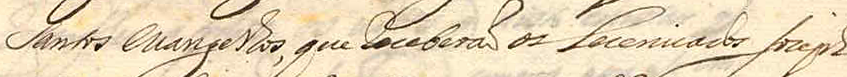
santos euangelhos, que Receberaõ os Lecenciados Jozeph
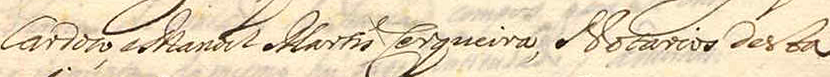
Cardozo, e Manoel Martis̄ Cerqueira, Notarios desta
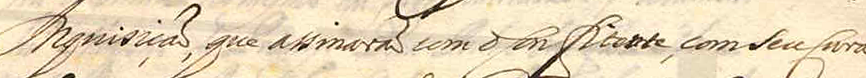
Inquisição, que assinarão com o Confitente, com seu Cura
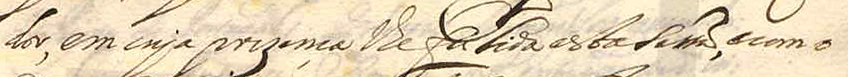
dor, em cuja prezença lhe foi lida esta sessão, e com o
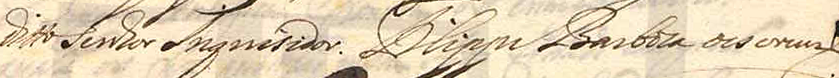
ditto senhor Inquisidor. Filippe Barboza o escreui.
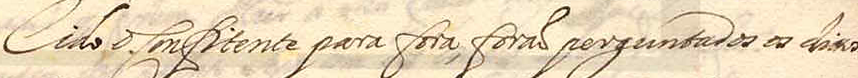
E ido o Confitente para fora, foraõ perguntados os dittos
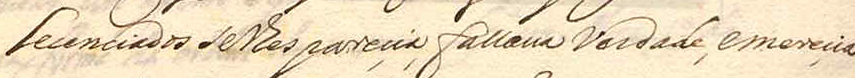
Lecenciados se lhes pareçia, fallaua verdade, e mereçia
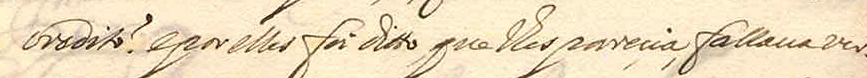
credito? e por elles foi ditto que lhes pareçia fallaua ver
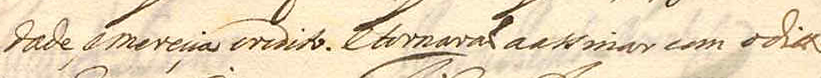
dade, e mereçia credito. e tornaraõ a assinar com o ditto
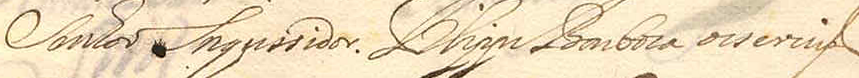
Senhor Inquisidor. Filippe Barboza o escreuj.
